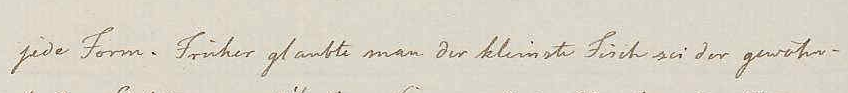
jede Form. Früher glaubte man der kleinste Fisch sei der gewöhn-
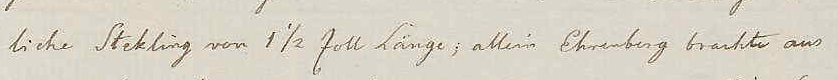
liche Stekling von 1½ Zoll Länge; allein Ehrenberg brachte aus
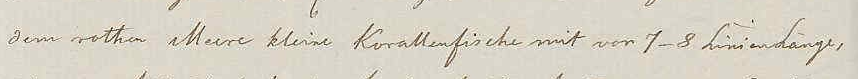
dem rothen Meere kleine Korallenfische mit vor 7–8 Linien Länge,
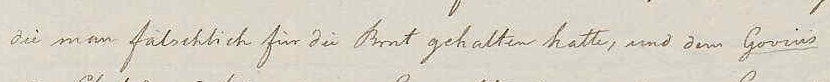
die man fälschlich für die Brut gehalten hatte, und dem Govins
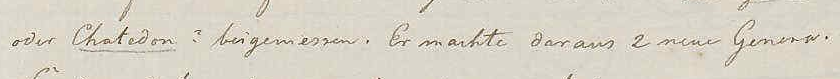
oder Chatedon ? beigemessen. Er machte daraus 2 neue Genera:
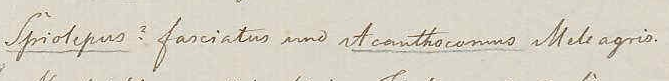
Spiolepus ? fasciatus und Acanthocomus Meleagris.
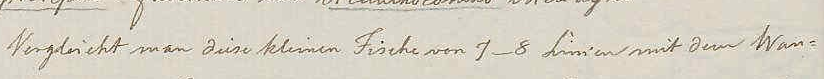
Vergleicht man diese kleinen Fische von 7–8 Linien mit dem Wan-
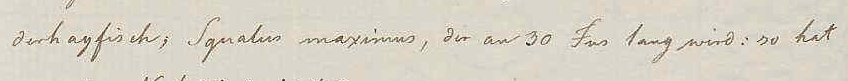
derhayfisch; Squalus maximus, der an 30 Fus lang wird: so hat
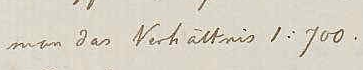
man das Verhältnis 1:700.
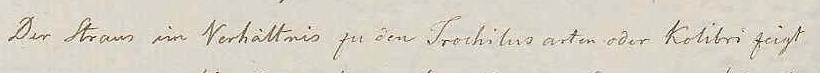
Der Straus im Verhältnis zu den Trochilus arten oder Kolibri zeigt
